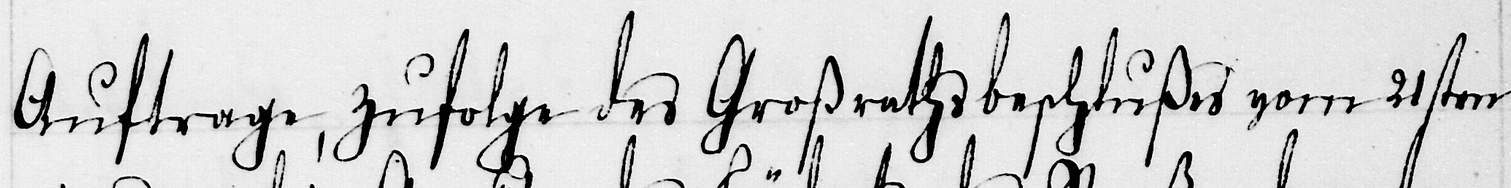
Auftrage, zufolge des Großrathsbeschlußes vom 21sten
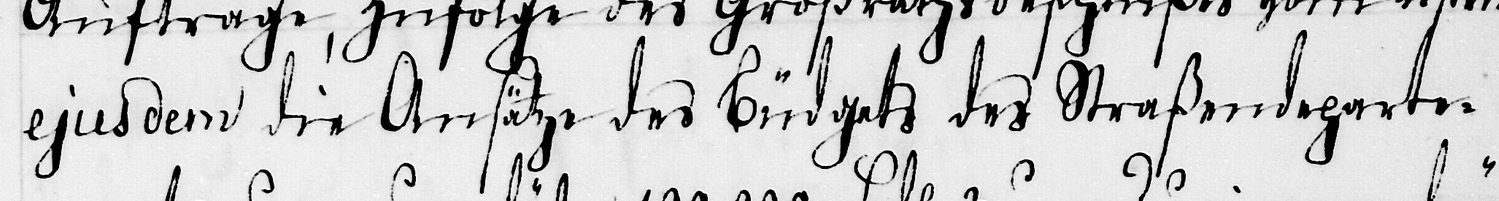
ejusdem die Ansätze des Büdgets des Straßendeparte¬
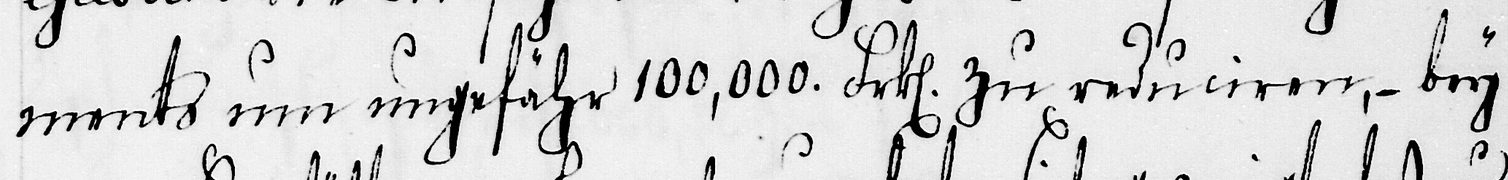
ments um ungefähr 100,000. Frk[en]. zu reduciren, – bey
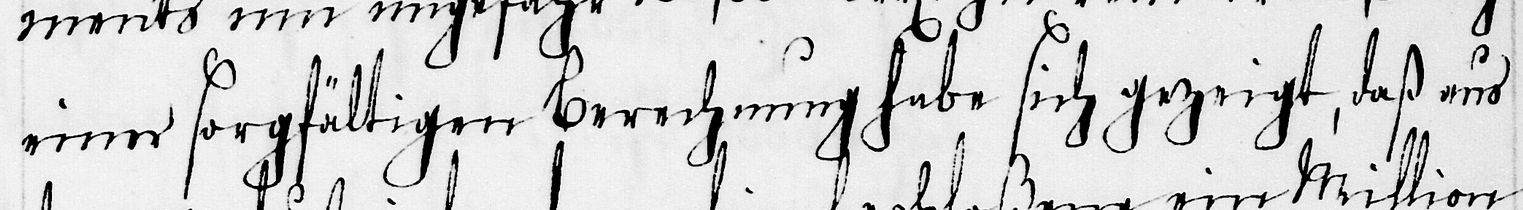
einer sorgfältigen Berechnung habe sich gezeigt, daß aus
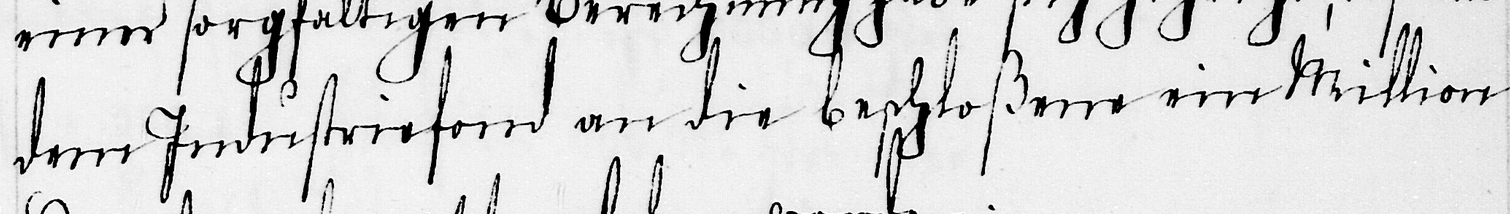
dem Industriefond an die beschloßene ein Million
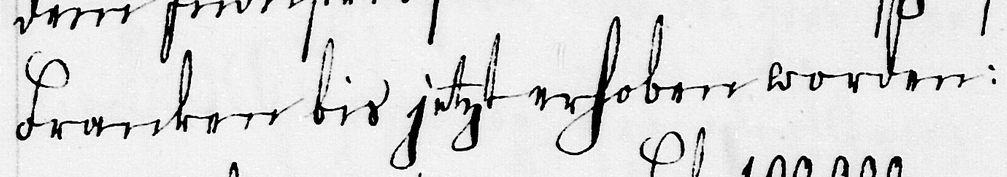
Franken bis jetzt erhoben worden:
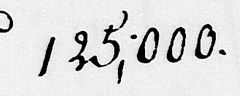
125,000.
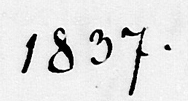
1837
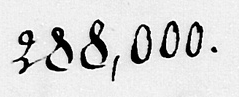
288,000.
